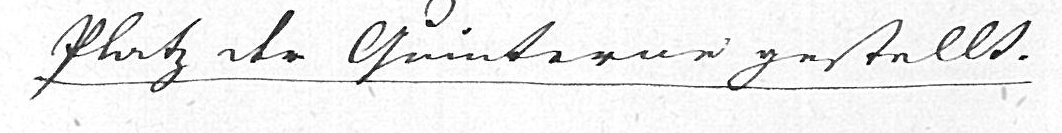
Platz der Quinterne gestellt.
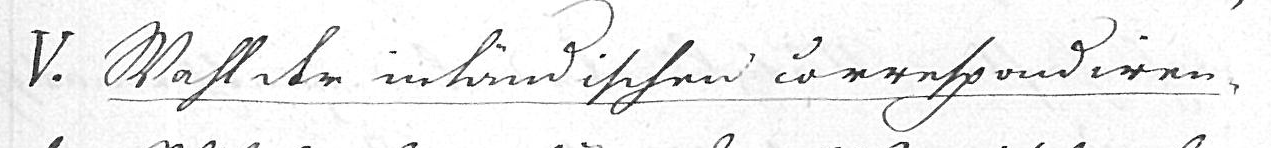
V. Wahl der inländischen correspondiren-
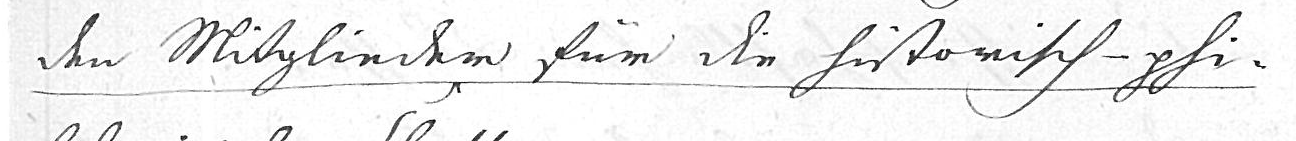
den Mitglieder für die historisch-phi-
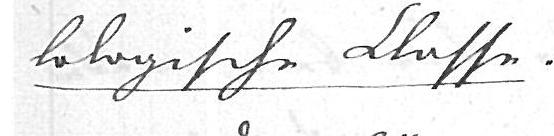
lologische Classe.
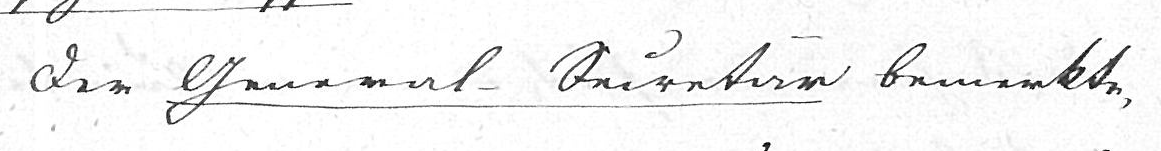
Der General-Secretär bemerkte,
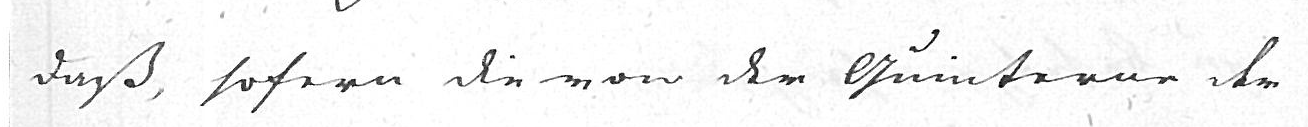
daß sofern die von der Quinterne der
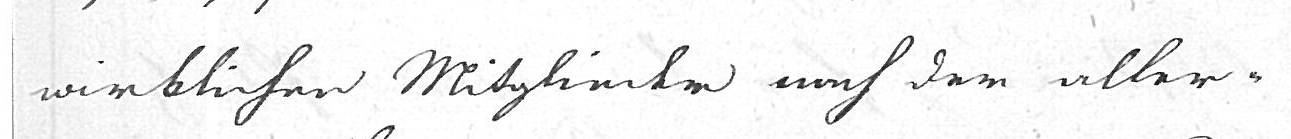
wirklichen Mitglieder nach der aller-
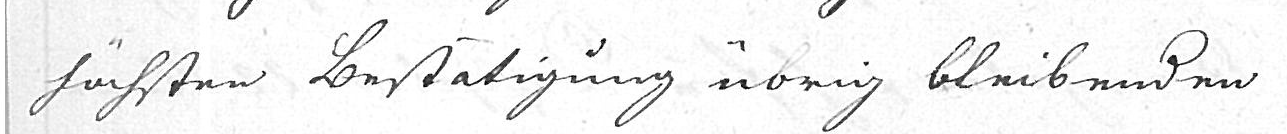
höchsten Bestätigung übrig bleibenden
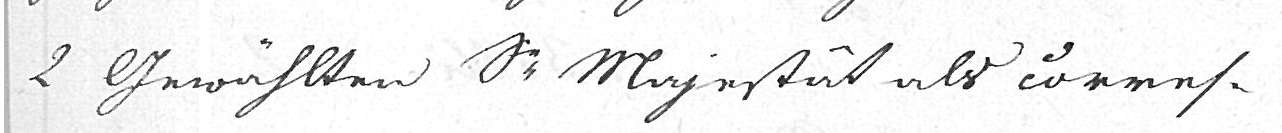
2 Gewählten Sr. Majestät als corres-
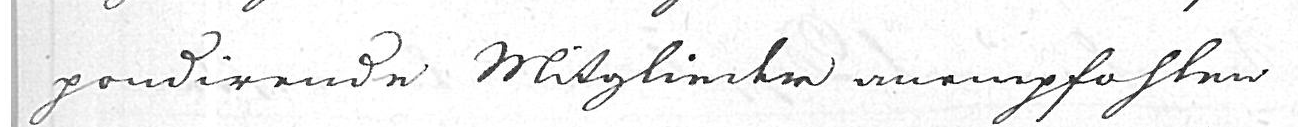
pondirende Mitglieder anempfohlen
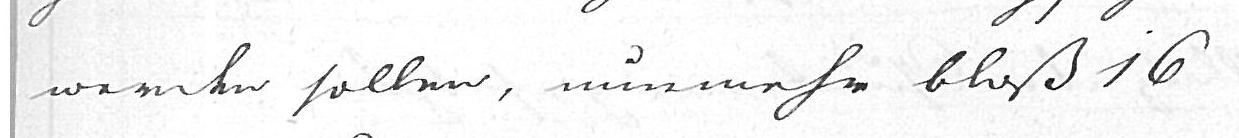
werden sollen, nunmehr bloß 16
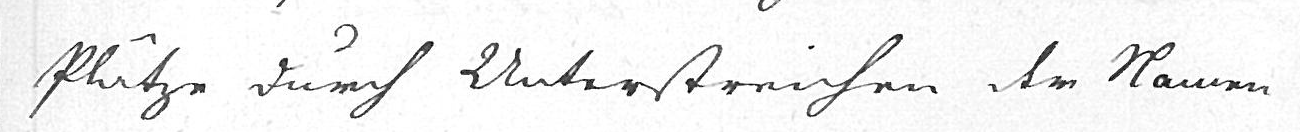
Plätze durch Unterstreichen der Namen
